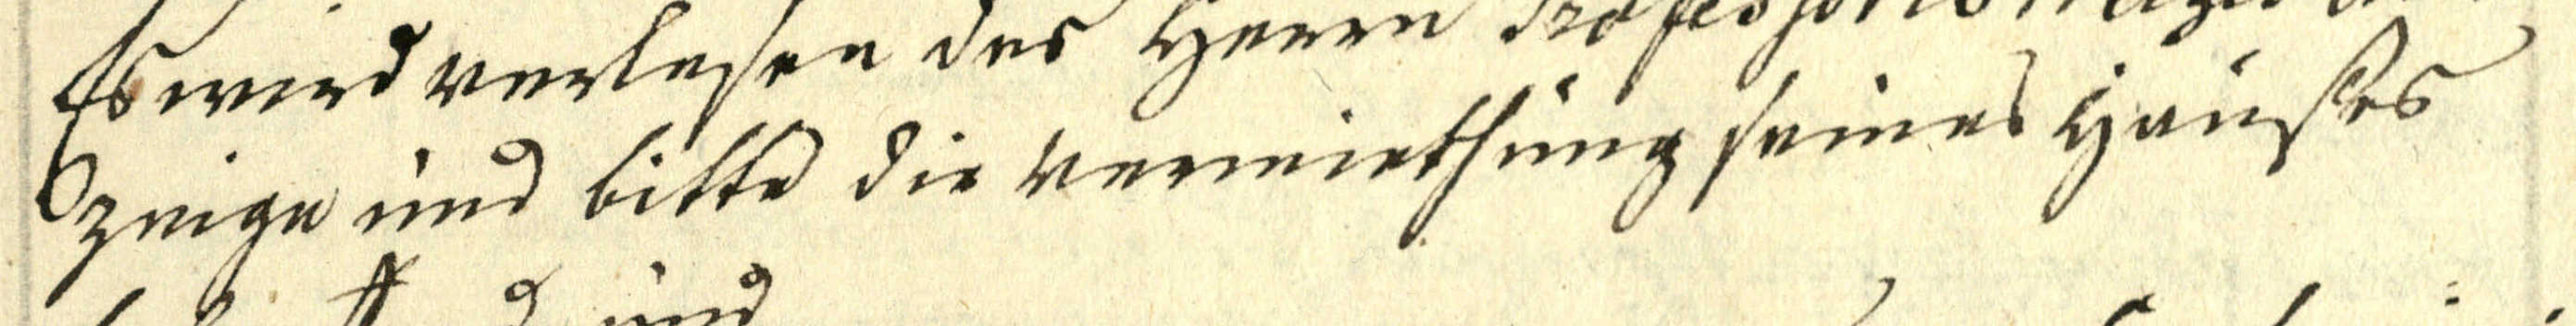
zeige und bitte die Vermiethung seines Haußes
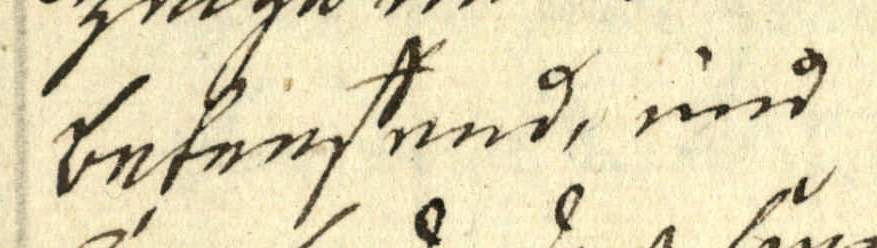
betreffend, und
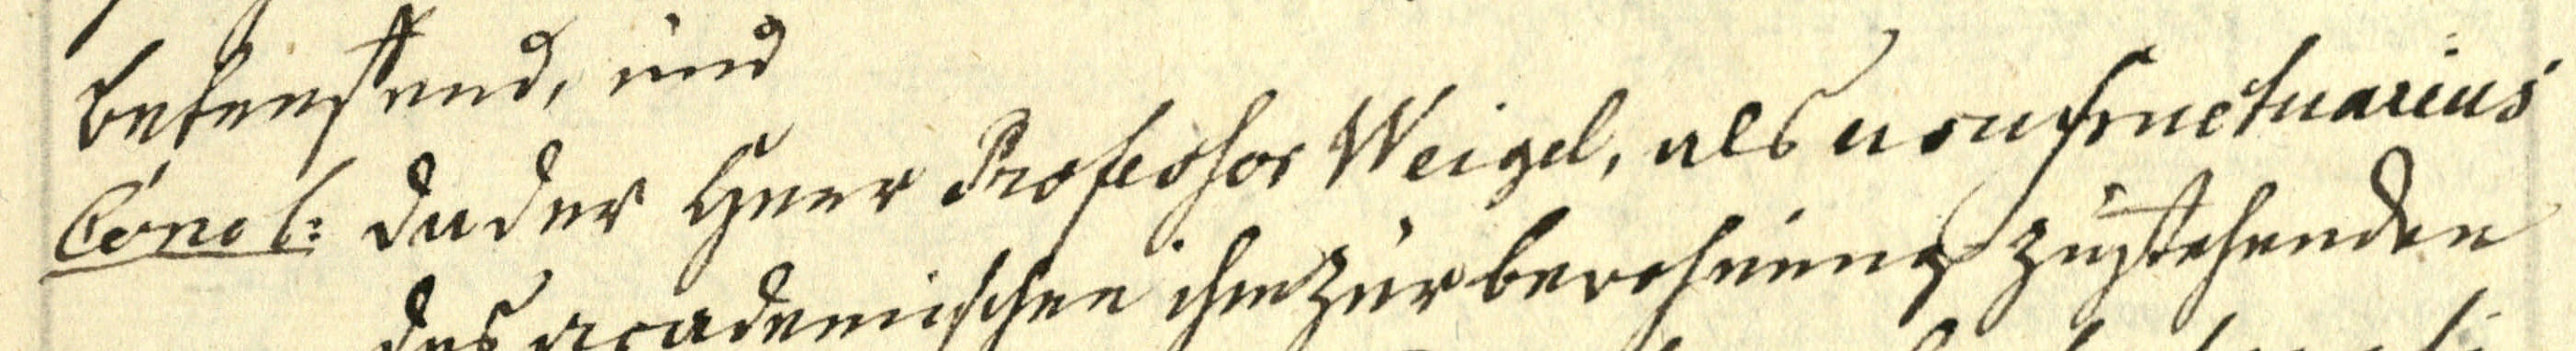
Concl. da der Herr Professor Weigel, als usufructuarus
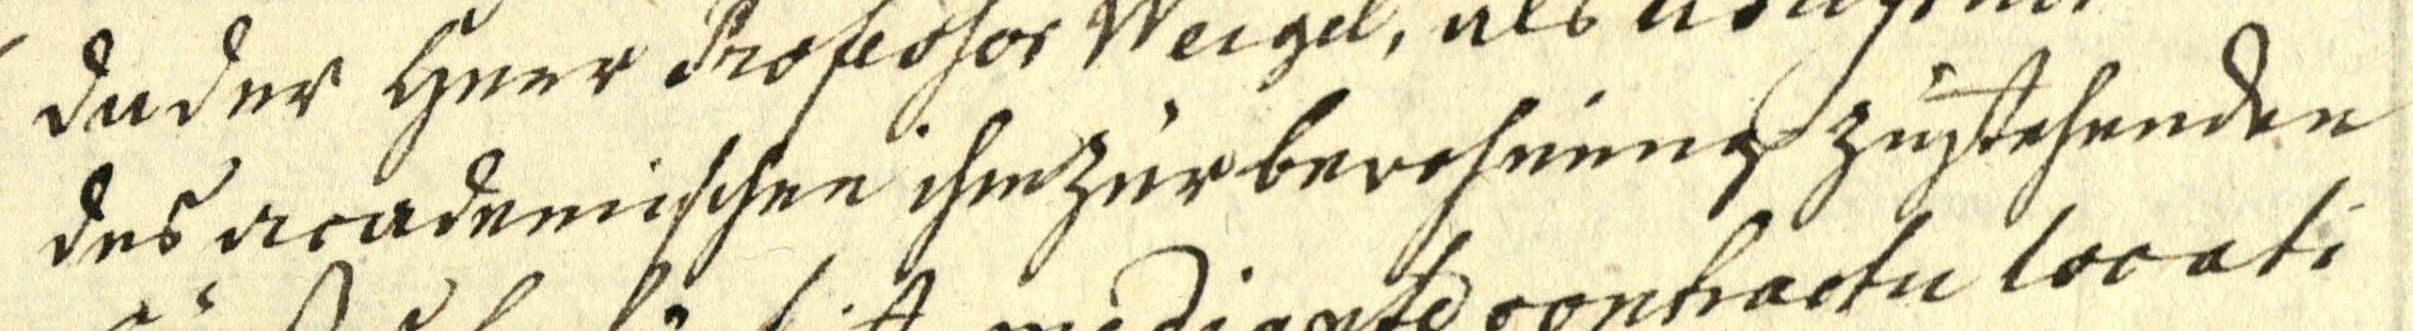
des academischen ihm zur bewohnung zustehenden
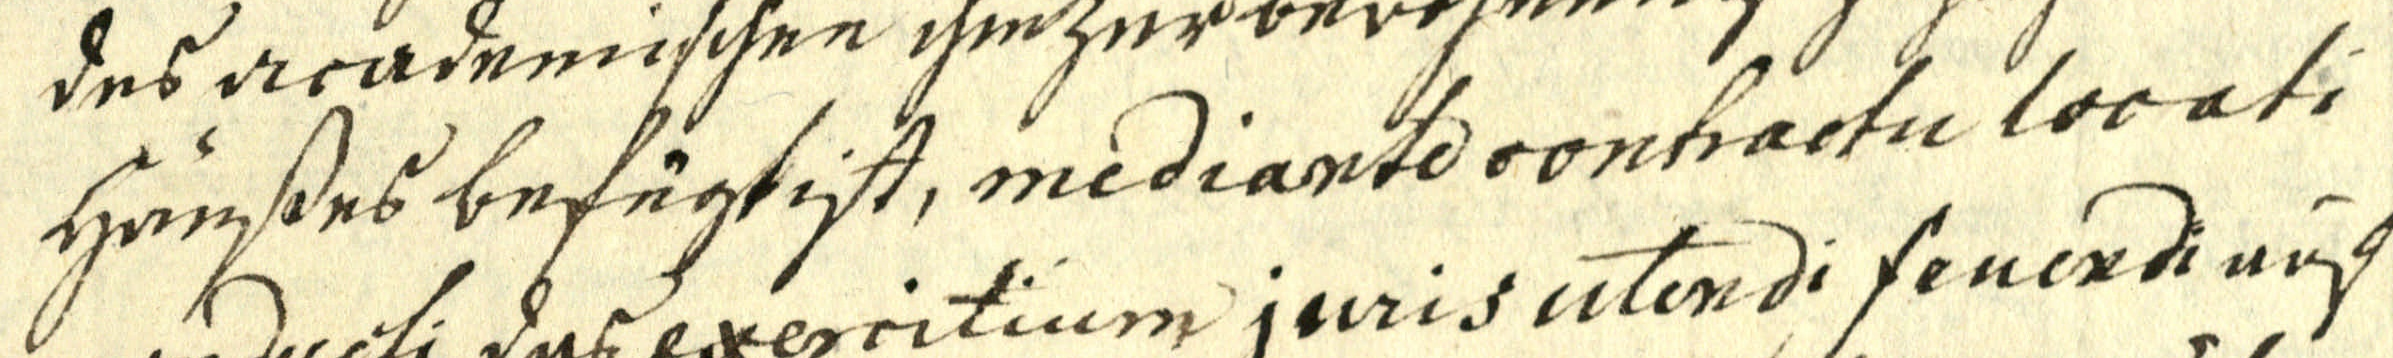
Haußes befugt ist, mediante contractu locati
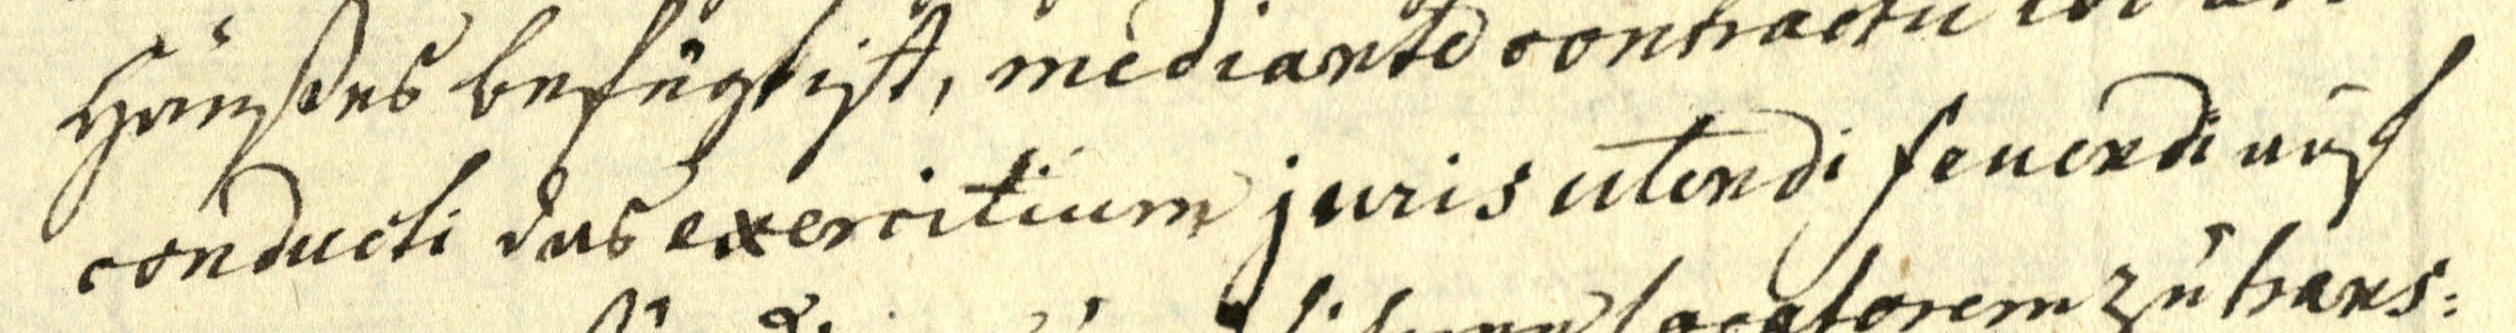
conducti das exercitium juris utendindi Fenendi auf
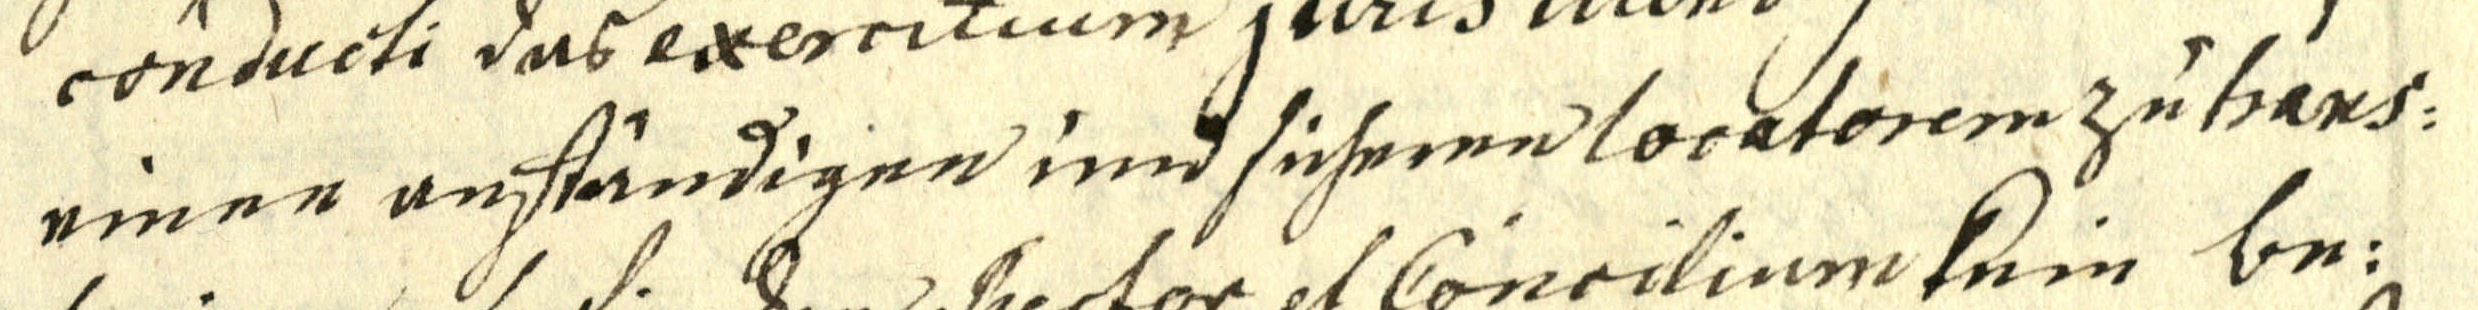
einen anständigen und sicheren locatorem zu trans¬
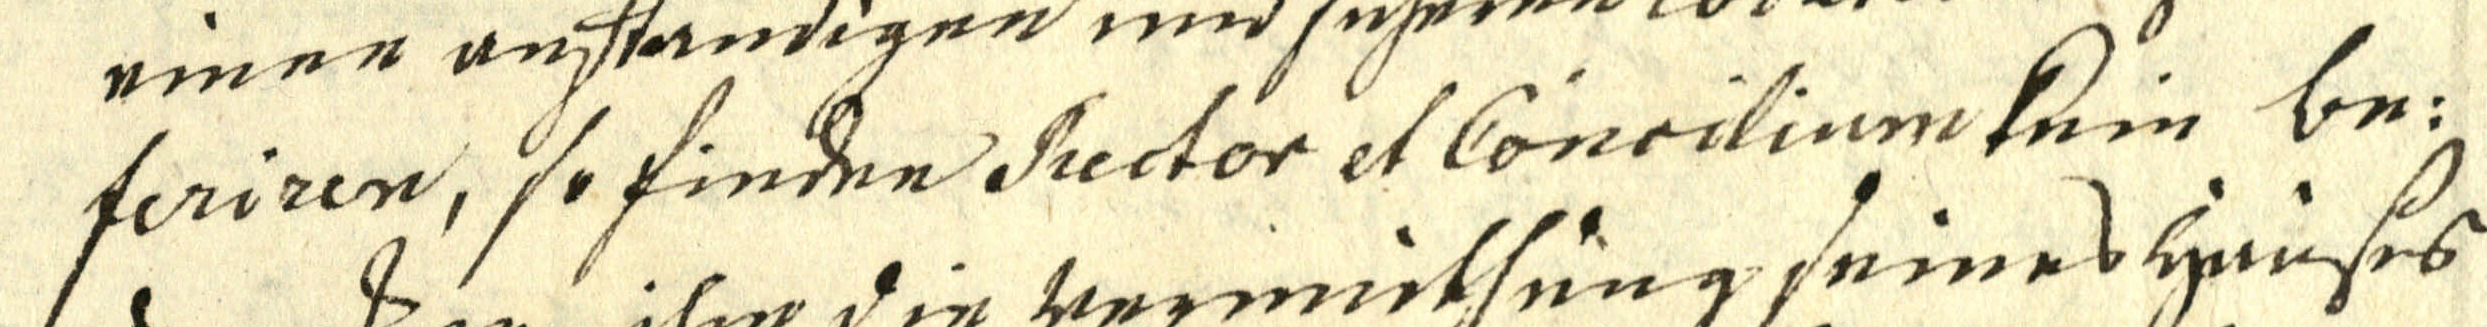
feriren, so finden Rector et Concilium kein Be¬
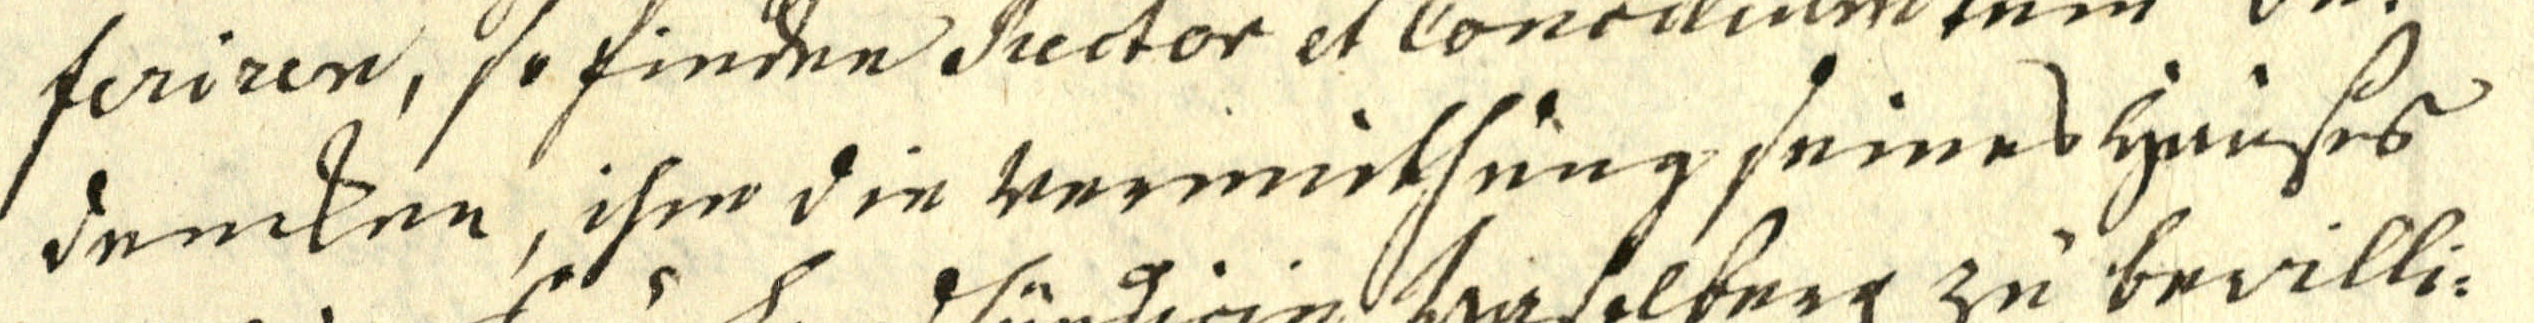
dencken, ihm die Vermiethung seines Haußes
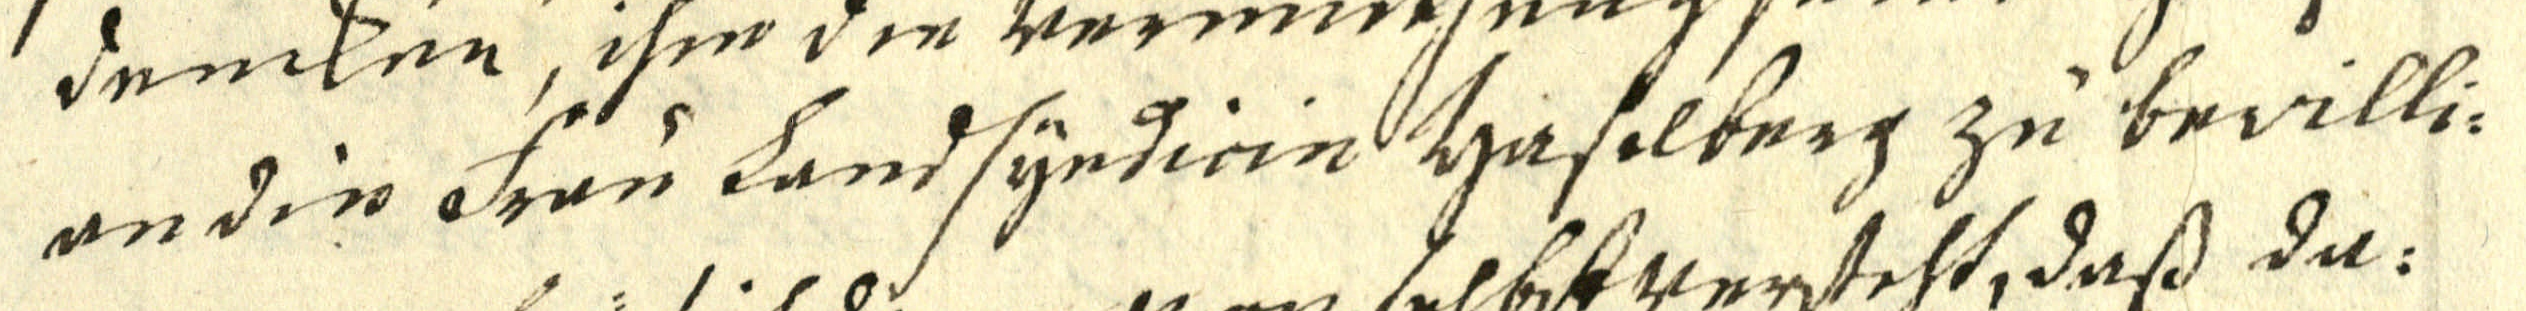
an die Frau Landsÿndicin Haselberg zu bewilli¬
